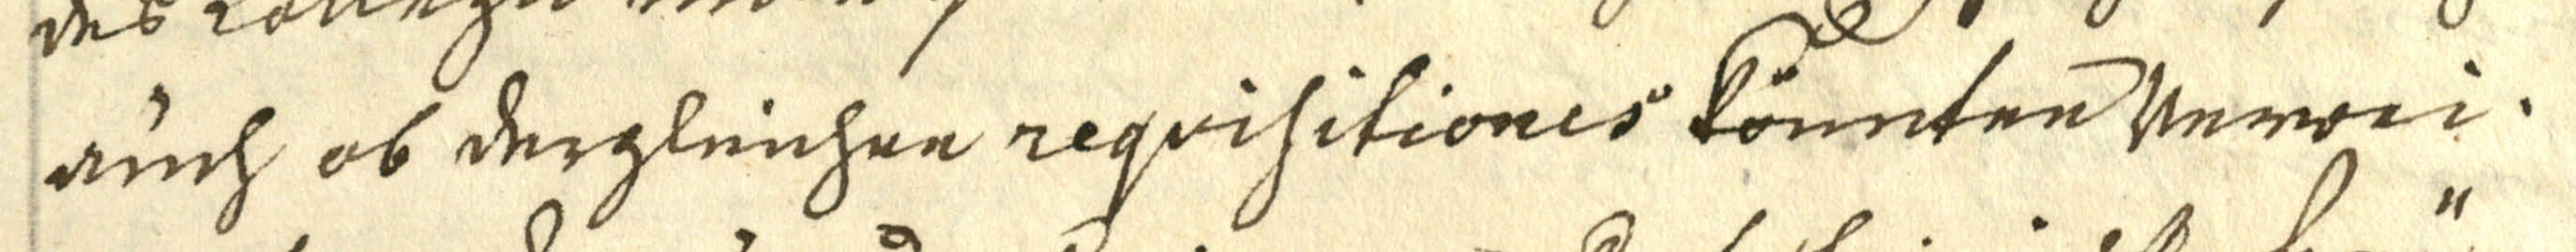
auch ob dergleichen requisitiones könnten verwei¬
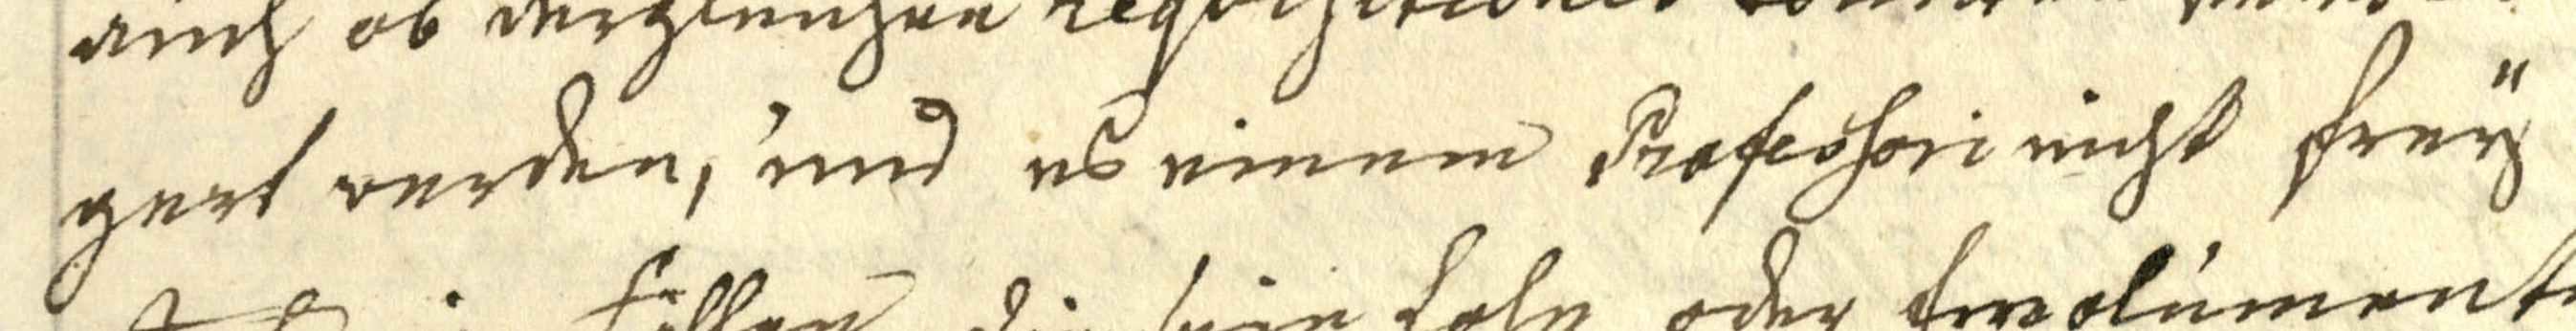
gert werden, und es einem Professori nicht freÿ
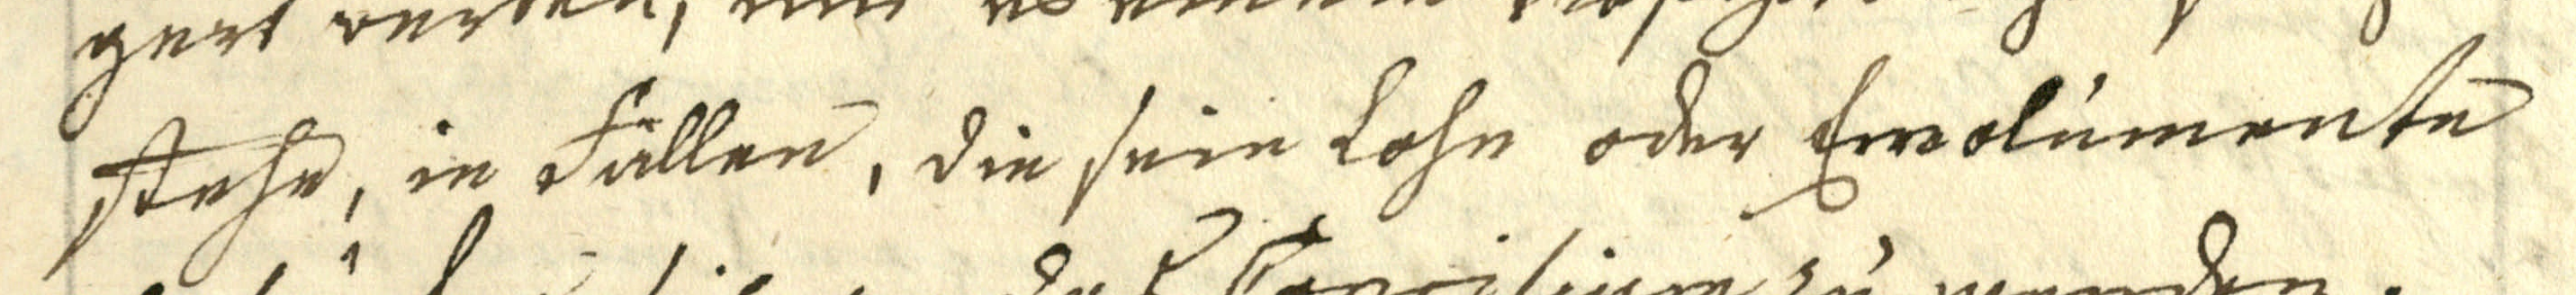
stehe, in Fällen, die sein Lohn oder Emolumente
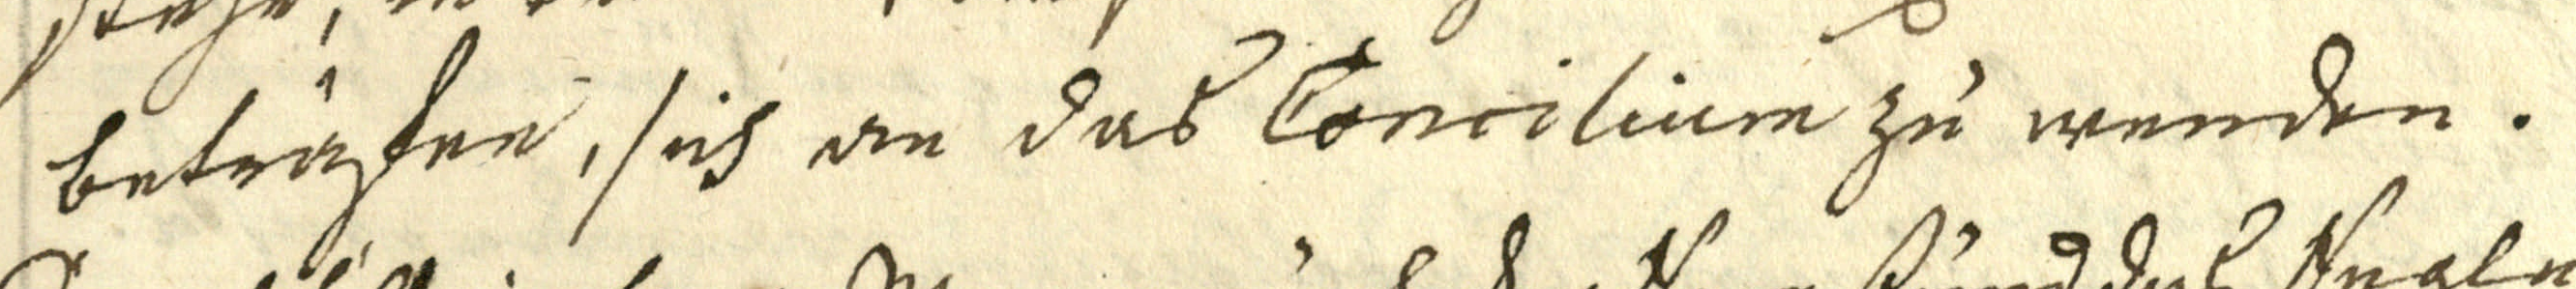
beträfen, sich an das Concilium zu wenden.
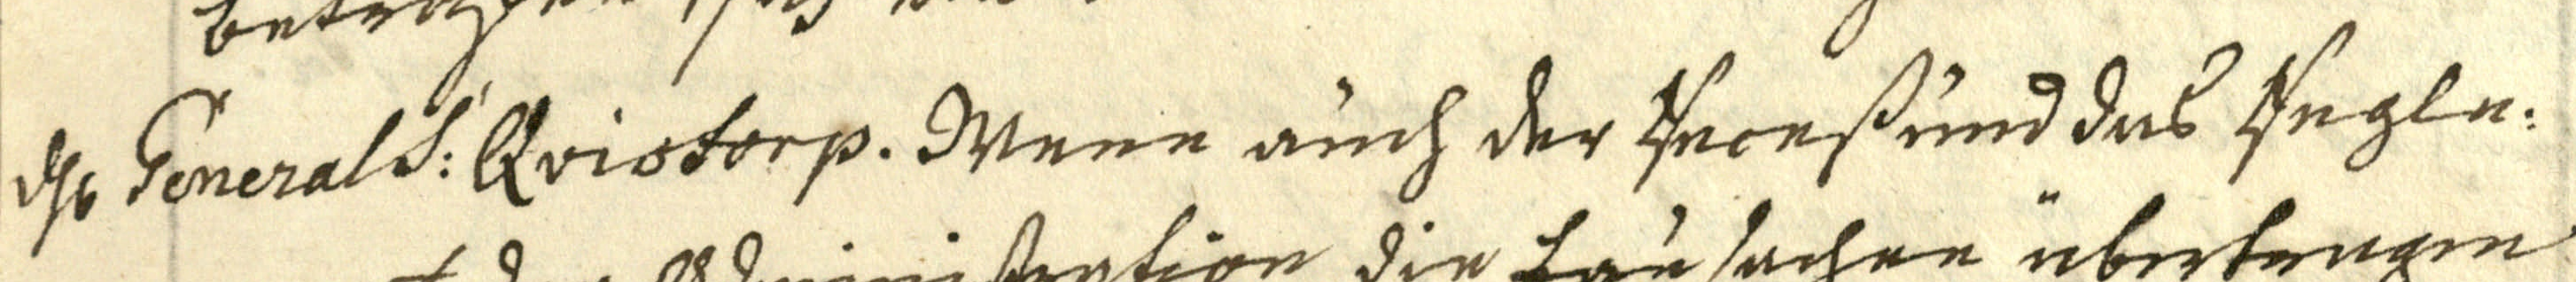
dh GeneralS. Quistorp. Wenn auch der Receß und das Regle¬
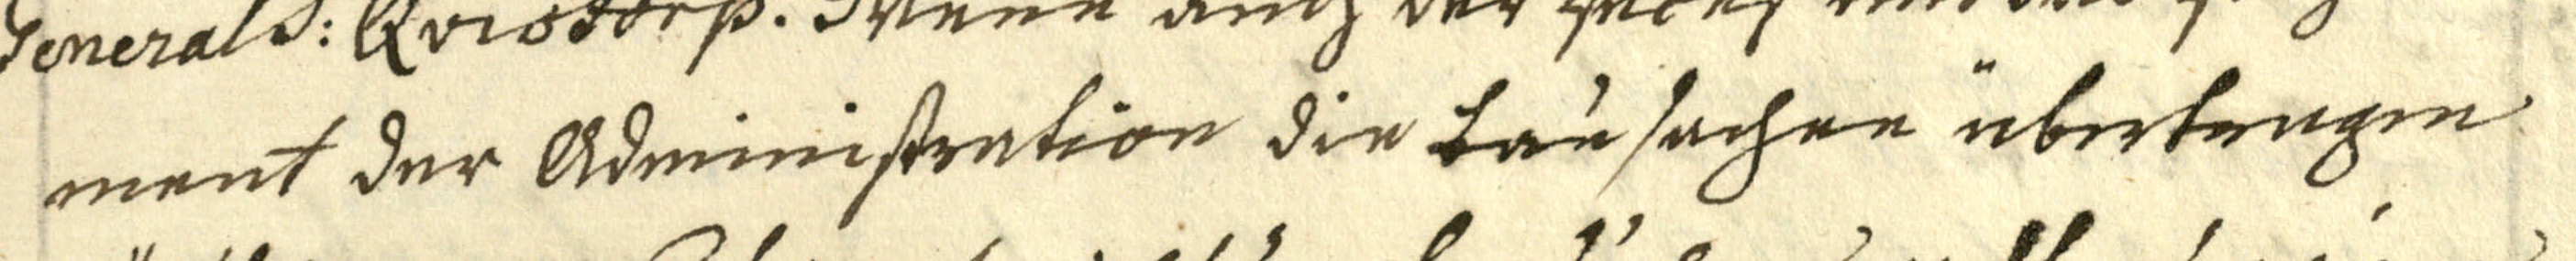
ment der Administration die Bausachen übertragen
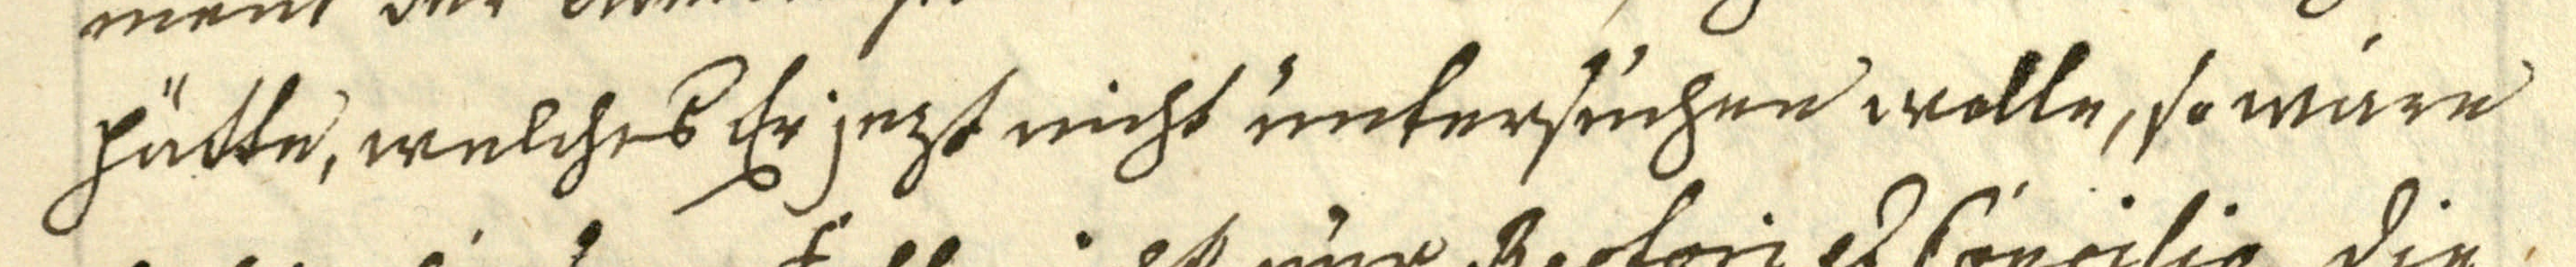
hätte, welches Er jezt nicht untersuchen wolle, so wäre
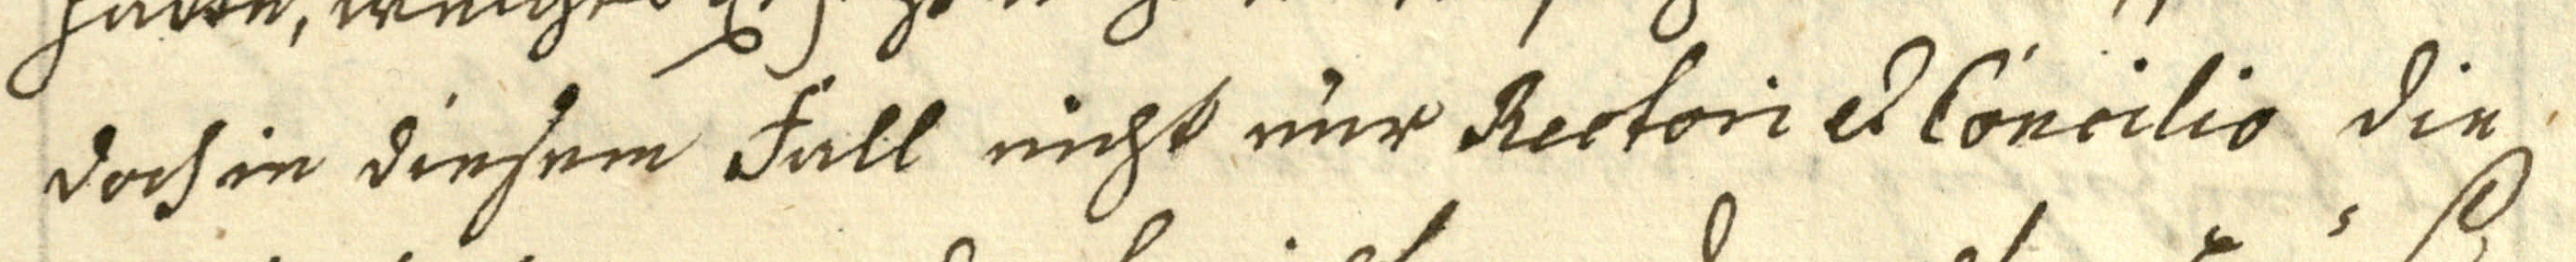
doch in diesem Fall nicht nur Rectori et Concilio die
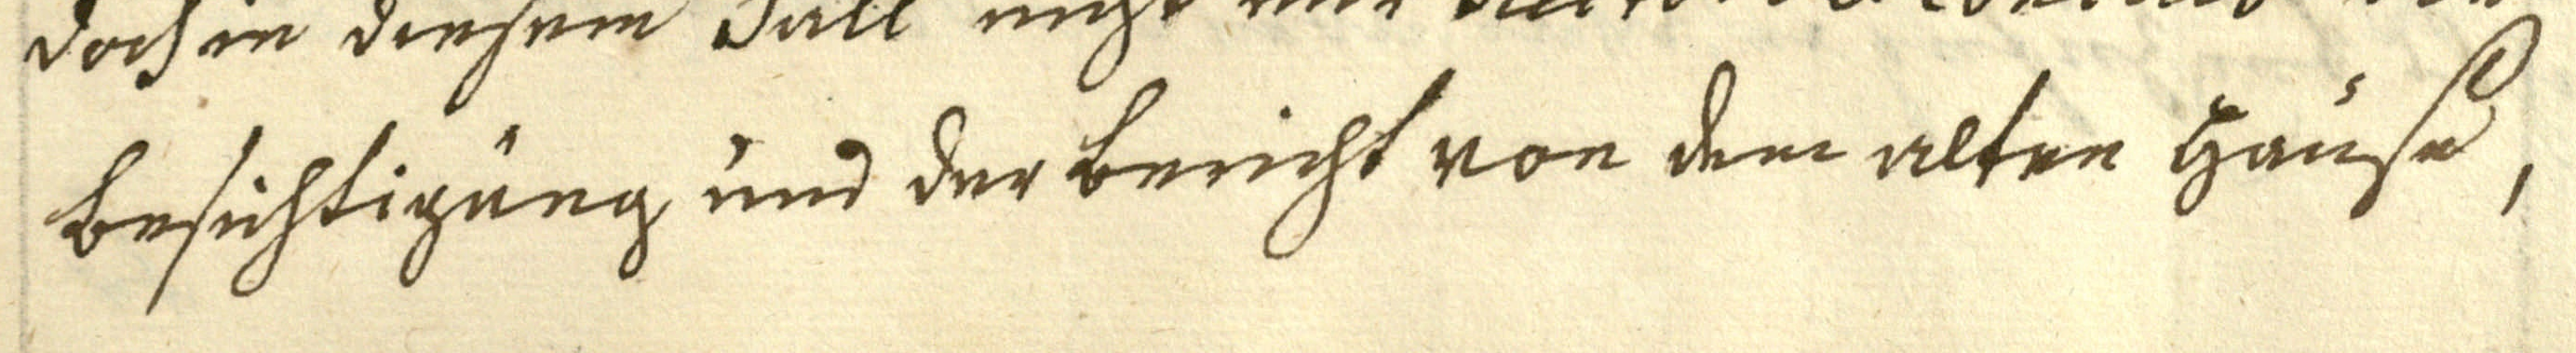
Besichtigung und der Bericht von dem alten Hause,
